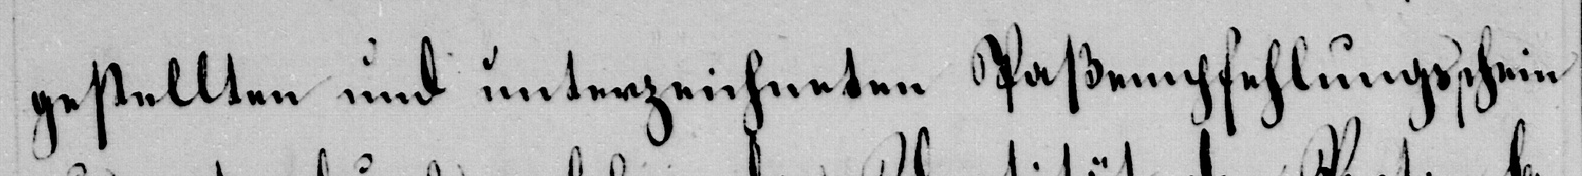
gestellten und unterzeichneten Paßempfehlungsschein
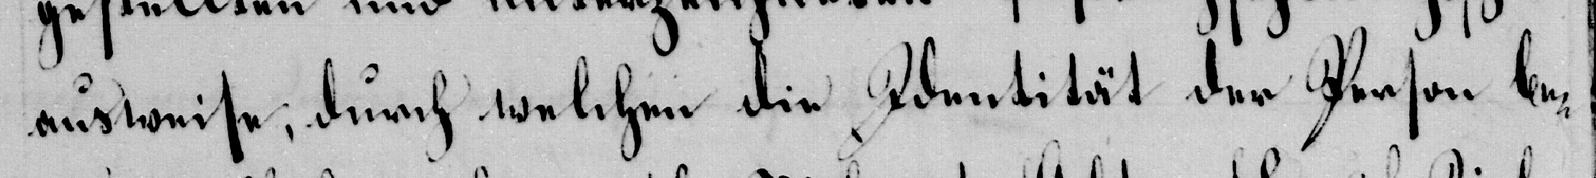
ausweise, durch welchen die Identität der Person be¬
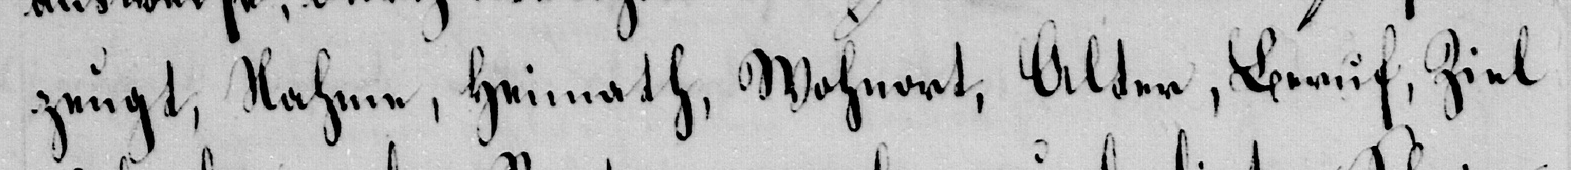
zeugt, Nahme, Heimath, Wohnort, Alter, Beruf, Ziel
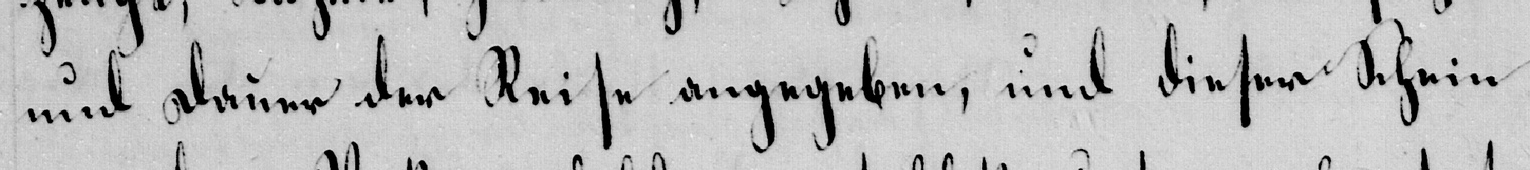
und Dauer der Reise angegeben, und dieser Schein
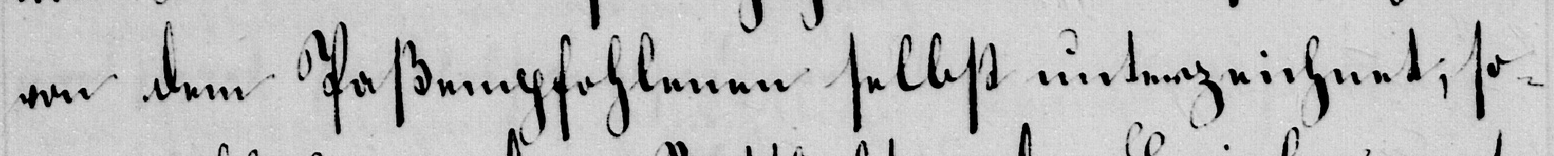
von dem Paßempfohlenen selbst unterzeichnet; so
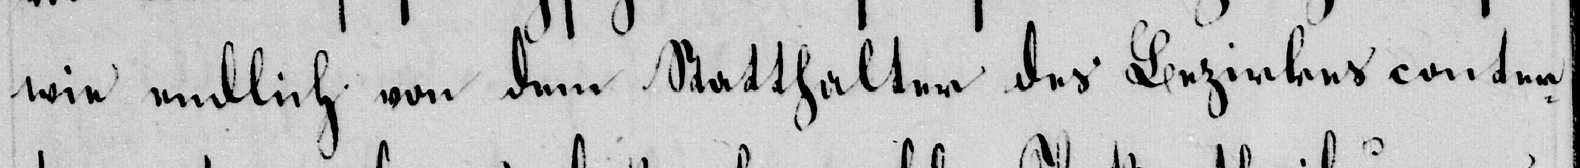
wie endlich von dem Statthalter des Bezirkes conter¬
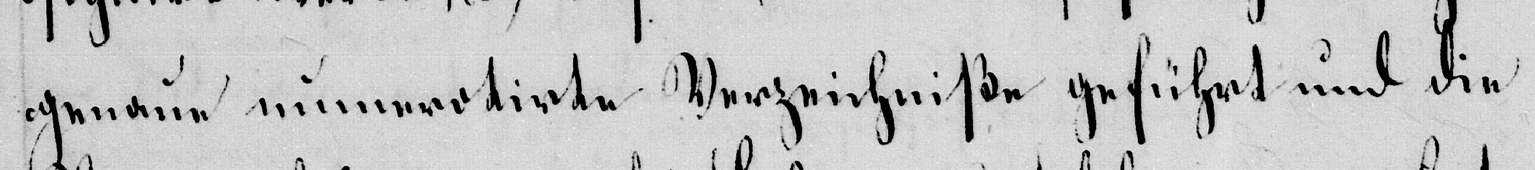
genau numerotirte Verzeichniße geführt und die
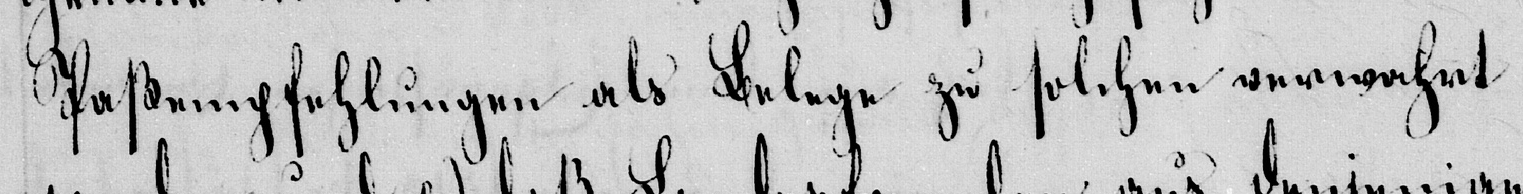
Paßempfehlungen als Belege zu solchen verwahret
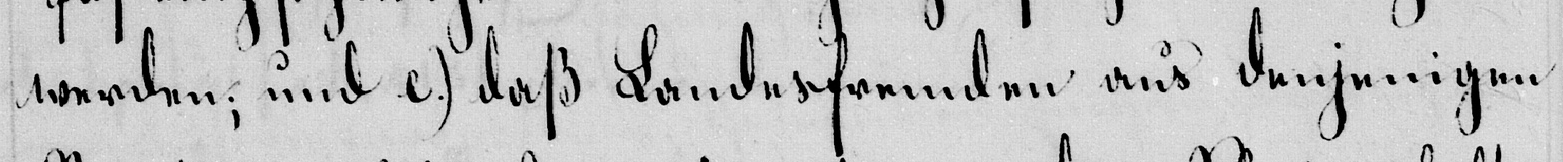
werden; und e.) daß Landesfremden aus denjenigen
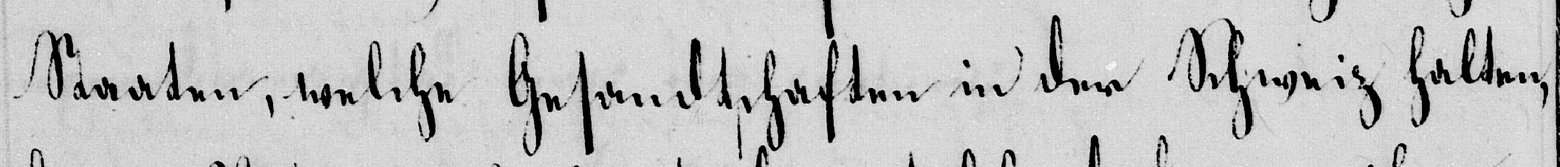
Staaten, welche Gesandtschaften in der Schweiz halten,
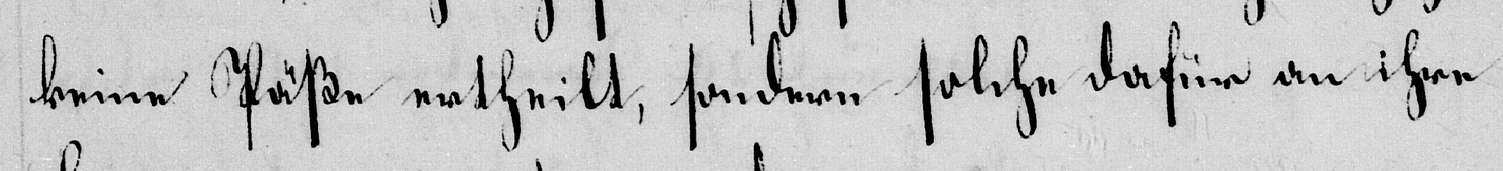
keine Päße ertheilt, sondern solche dafür an ihre
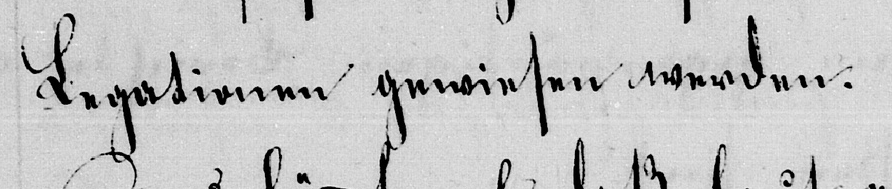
Legationen gewiesen werden.
